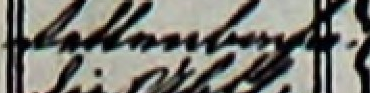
Dettenbach?.
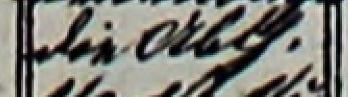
die Abth.
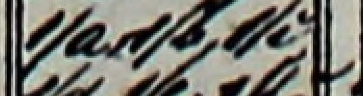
1/a, 1/b, 1/c
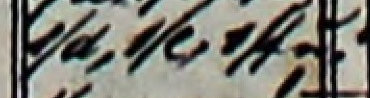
1/d, 1/e, 1/f u.
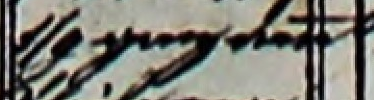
1/g ganz dann
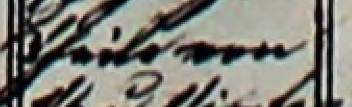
Theile von
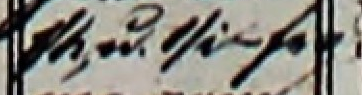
1/h, u. 1/i fe?
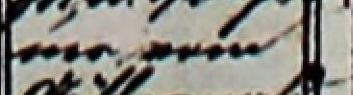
ner vom
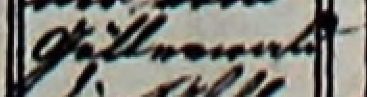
Göllerwald
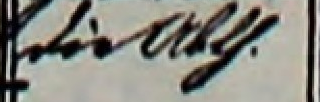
die Abth.
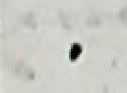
,
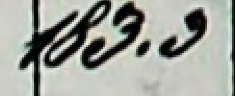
183,3
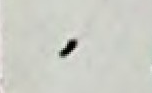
,
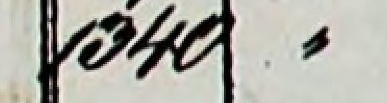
1340 „
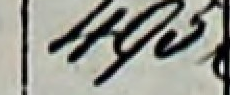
495
